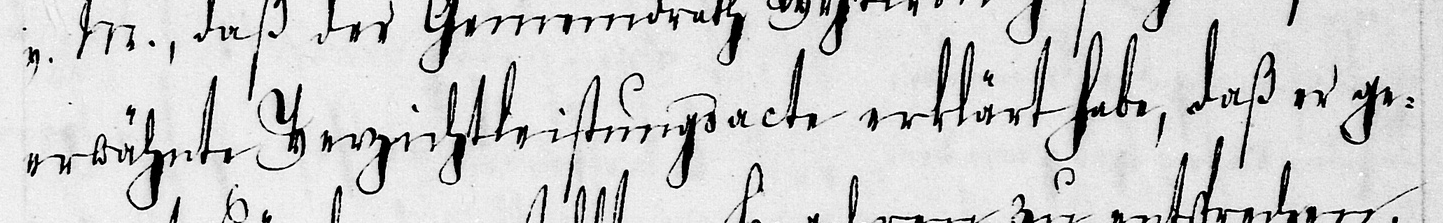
erwähnte Verzichtleistungsacte erklärt habe, daß er ge¬
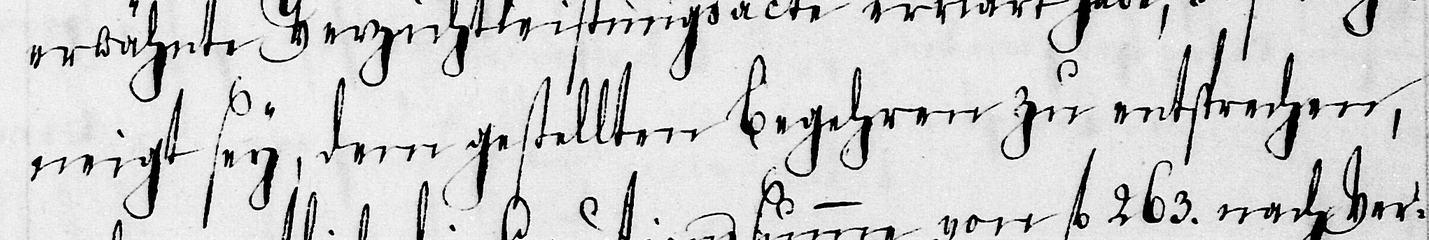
neigt sey, dem gestellten Begehren zu entsprechen,
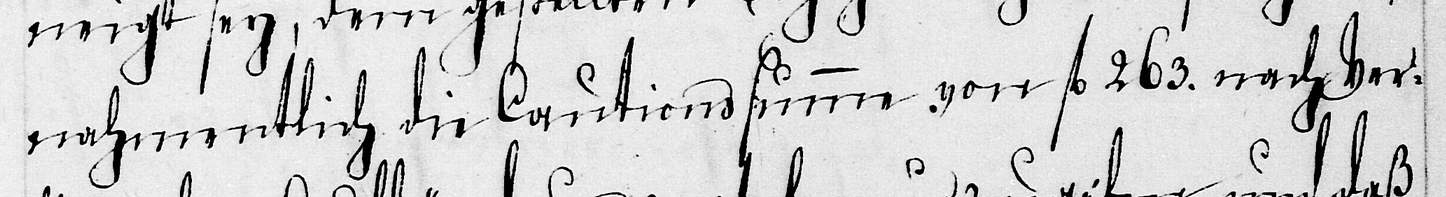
nahmentlich die Cautionssumme von fl. 263. nach Ver¬
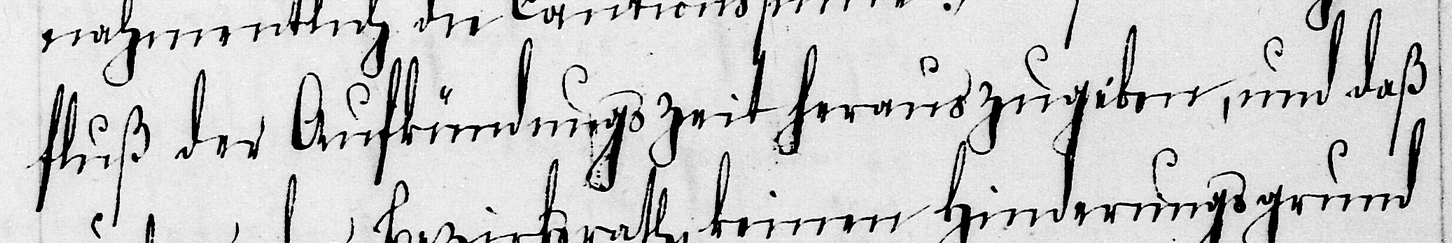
fluß der Aufkündungszeit herauszugeben, und daß
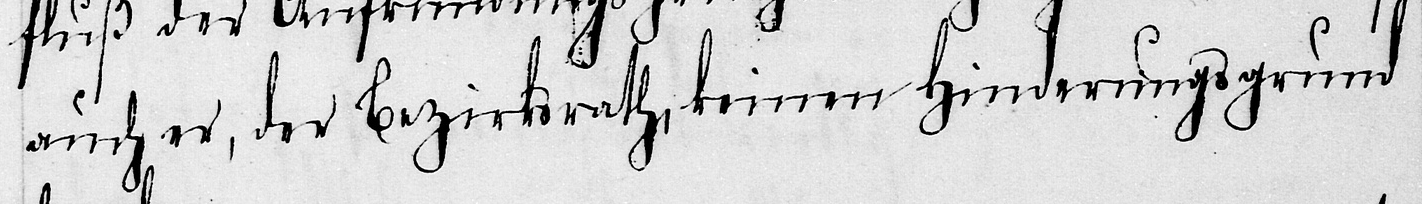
auch er, der Bezirksrath, keinen Hinderungsgrund
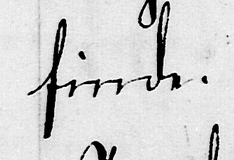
finde.
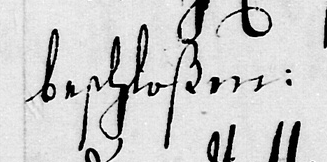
beschloßen:
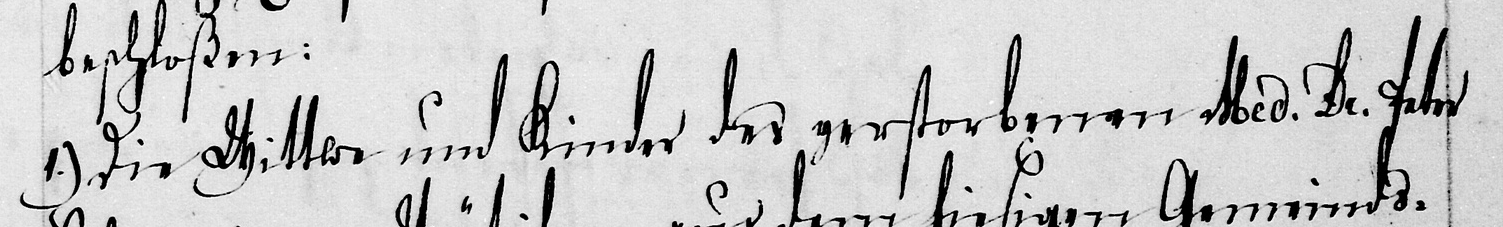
1.) Die Wittwe und Kinder des verstorbenen Med. Dr. Peter
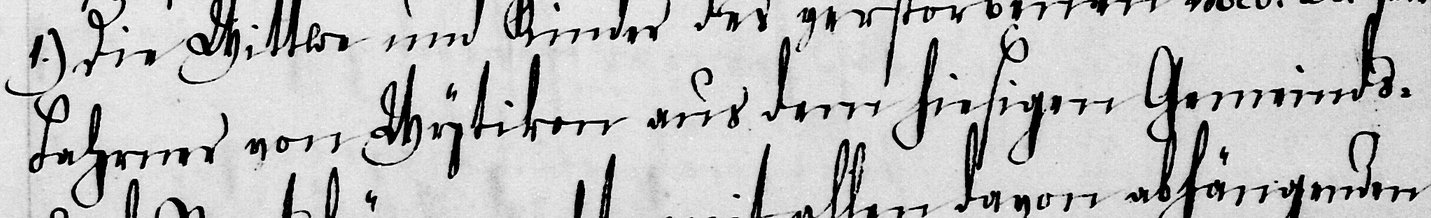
Fahrner von Wytikon aus dem hiesigen Gemeinds-
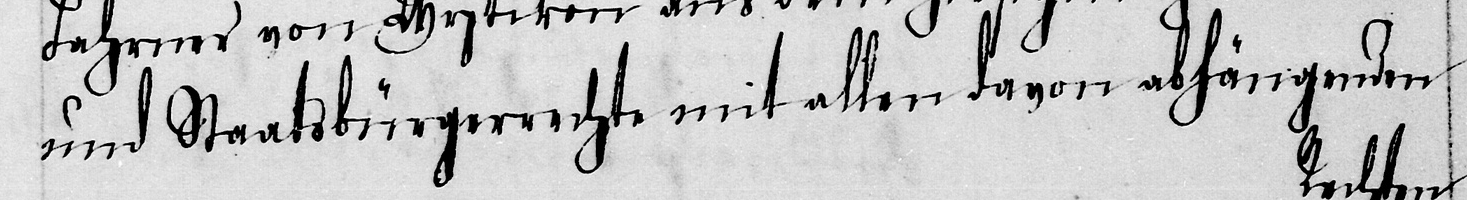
und Staatsbürgerrechte mit allen davon abhängenden
